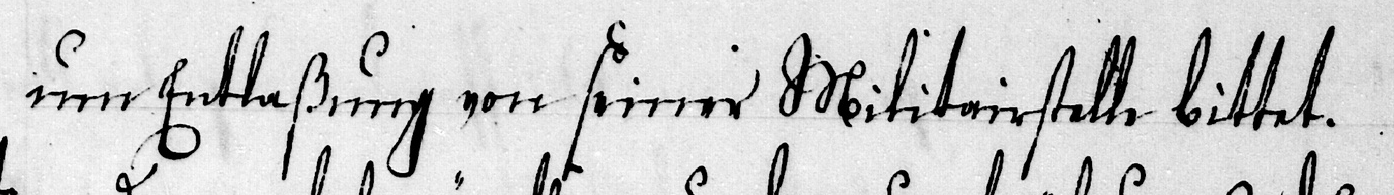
um Entlaßung von seiner Militairstelle bittet.
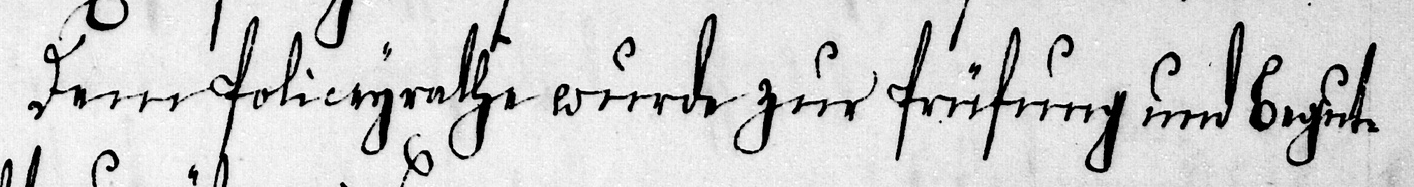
Dem Policeyrathe wurde zur Prüfung und Begut¬
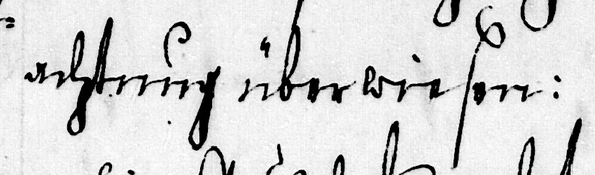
achtung überwiesen:
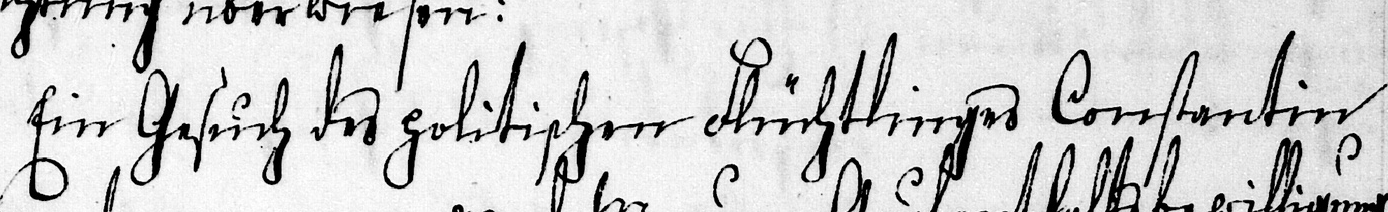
Ein Gesuch des politischen Flüchtlings Constantin
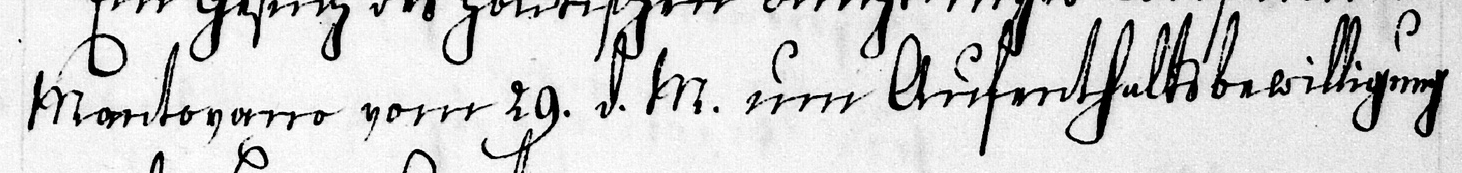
Mantovano vom 29. d. M. um Aufenthaltsbewilligung
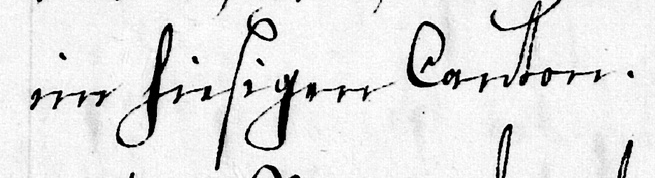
im hiesigen Canton.
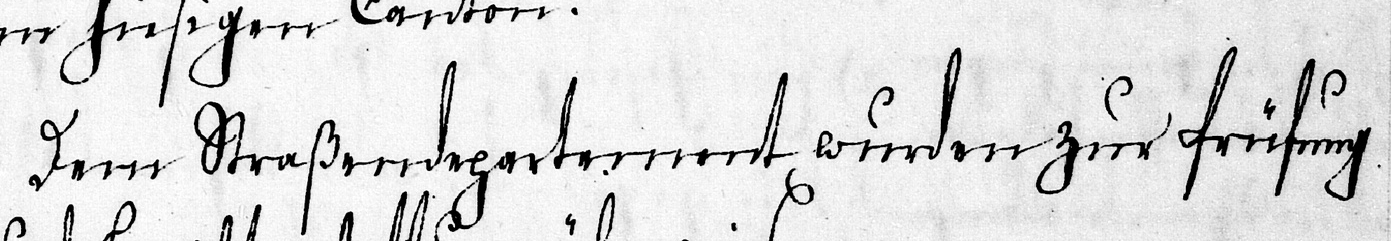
Dem Straßendepartement wurden zur Prüfung
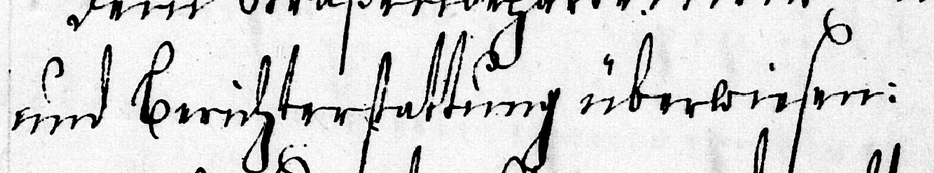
und Berichterstattung überwiesen:
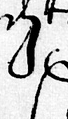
1.)
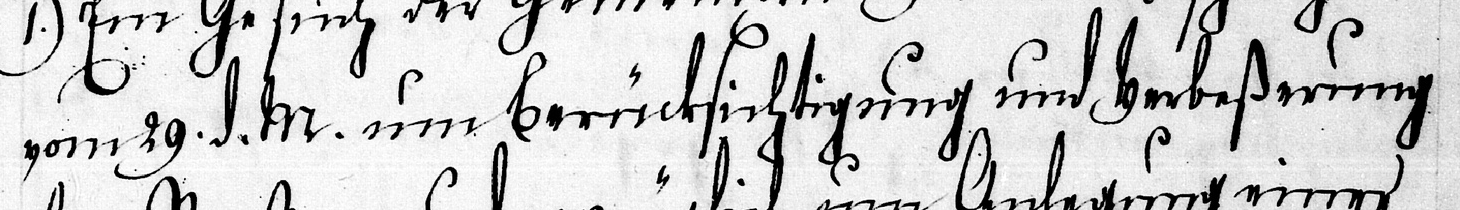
vom 29. d. M. um Berücksichtigung und Verbeßerung
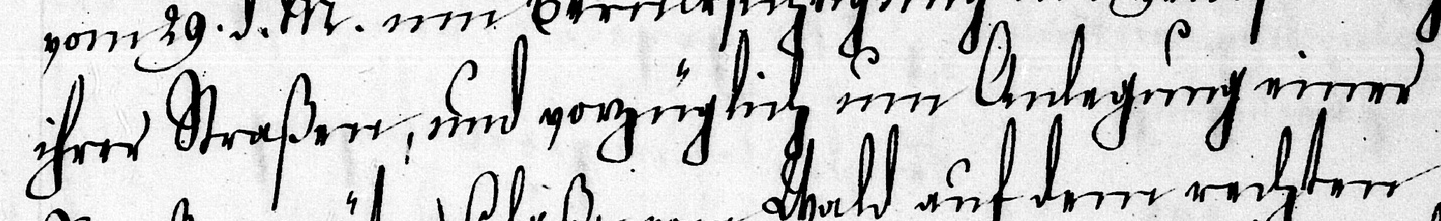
ihrer Straßen, und vorzüglich um Anlegung einer
